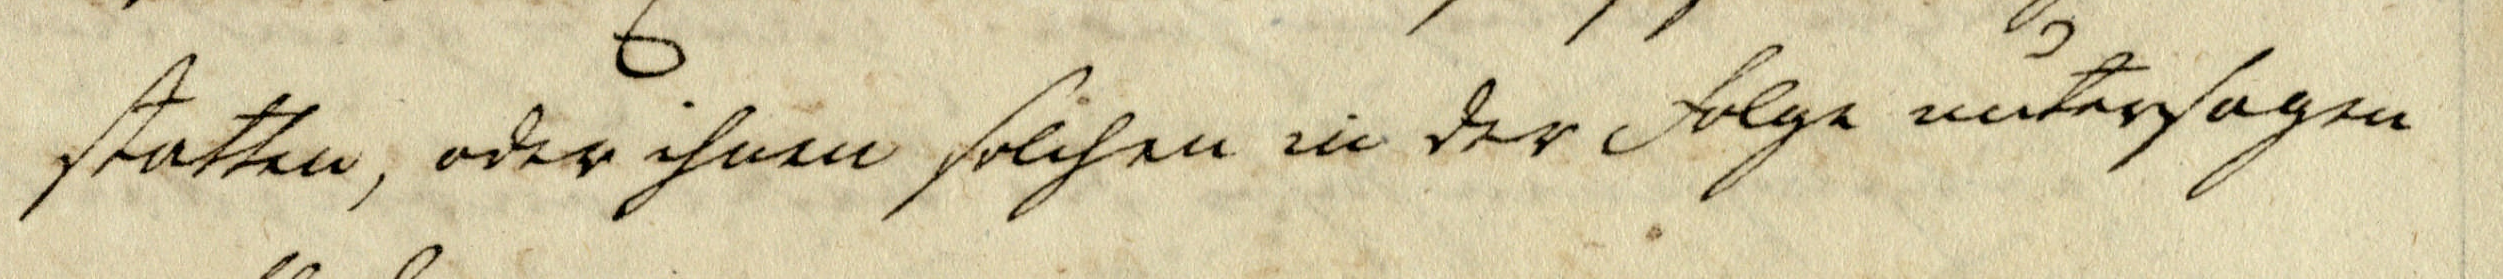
statten, oder ihnen solchen in der Folge untersagen
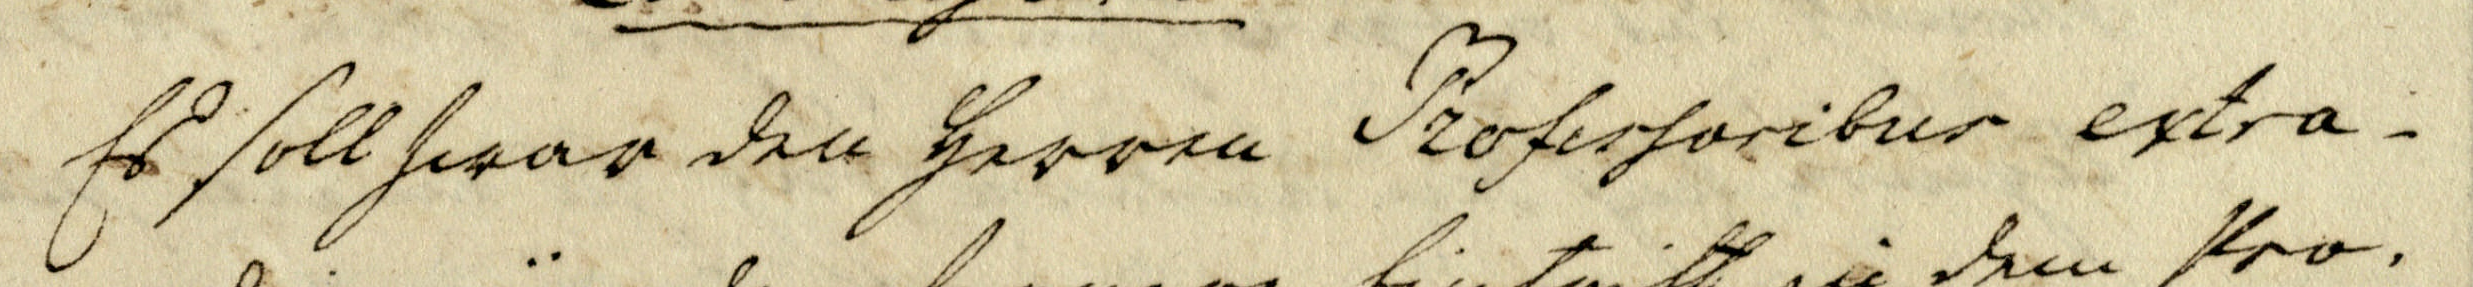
Es soll zwar den Herren Professoribus extra¬
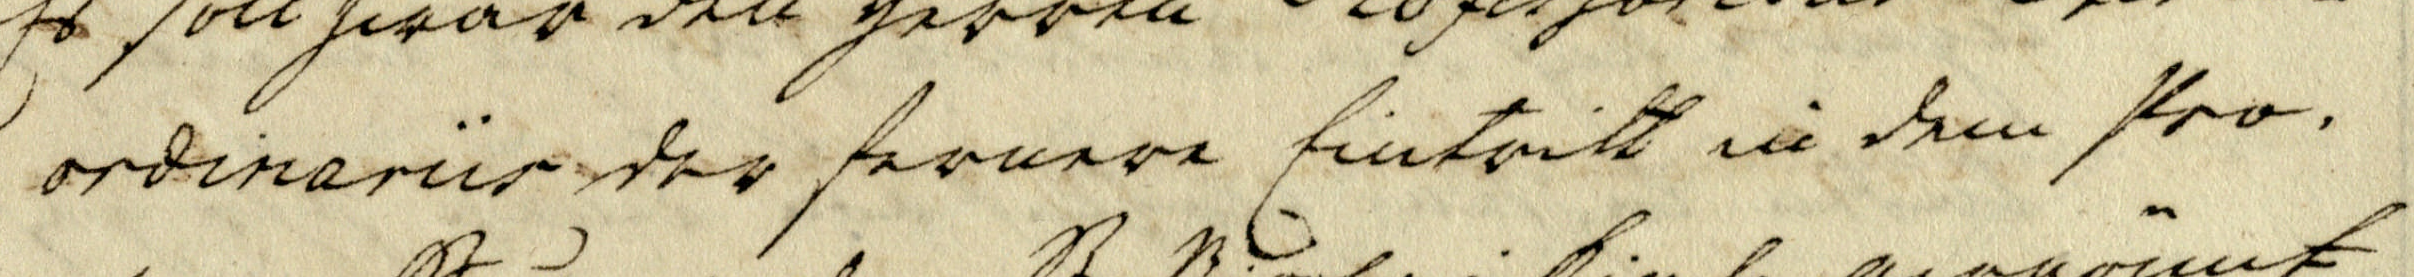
ordinariis der fernere Eintritt in dem Pro¬
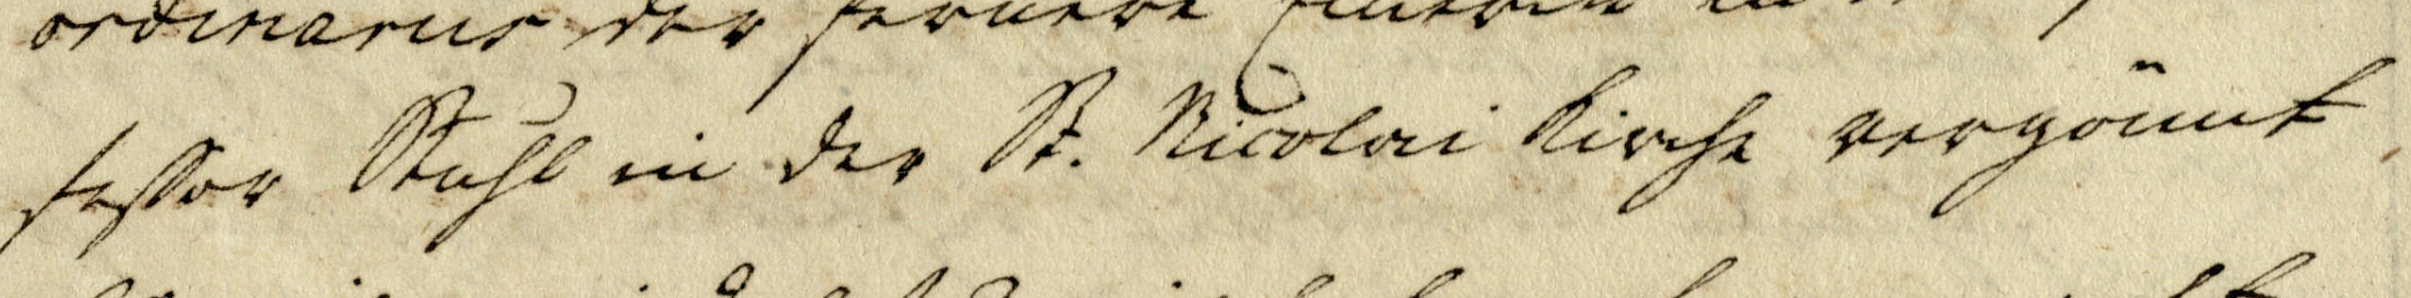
fessor Stuhl in der St. Nicolai Kirche vergönnt
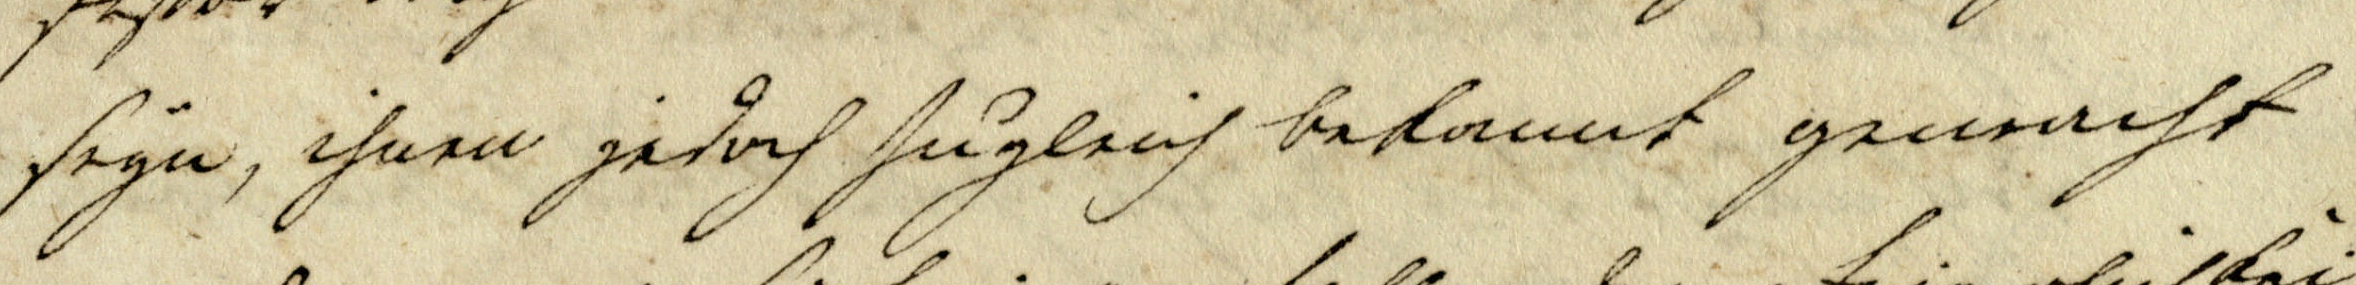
seÿn, ihnen jedoch zugleich bekannt gemacht
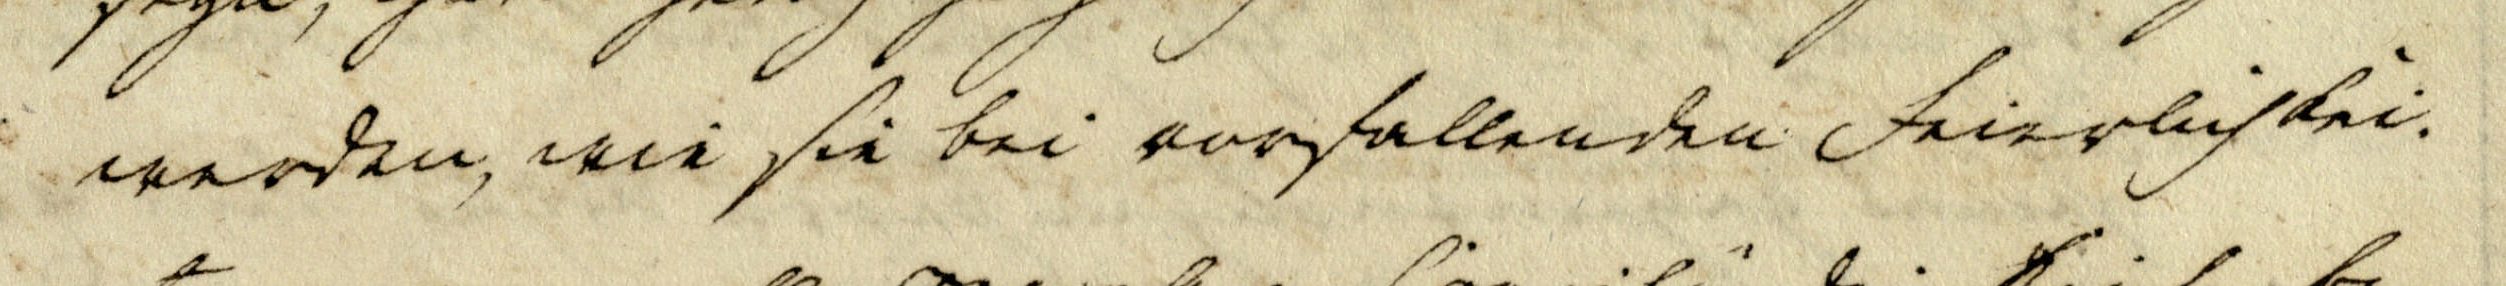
werden, wie sie bei vorfallenden Feierlichkei¬
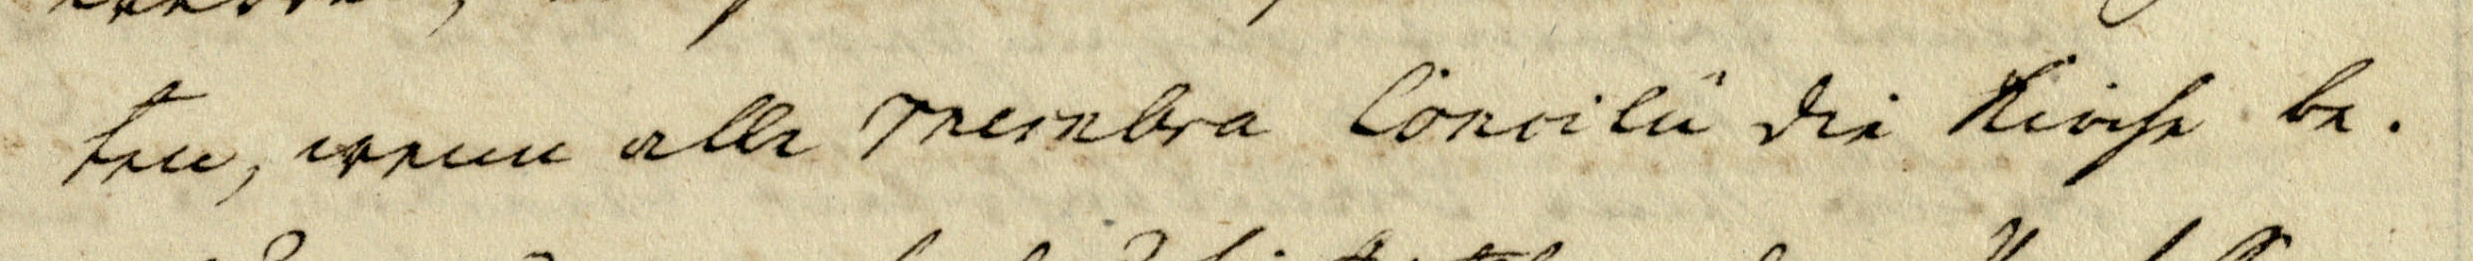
ten, wenn alle membra Concilii die Kirche be¬
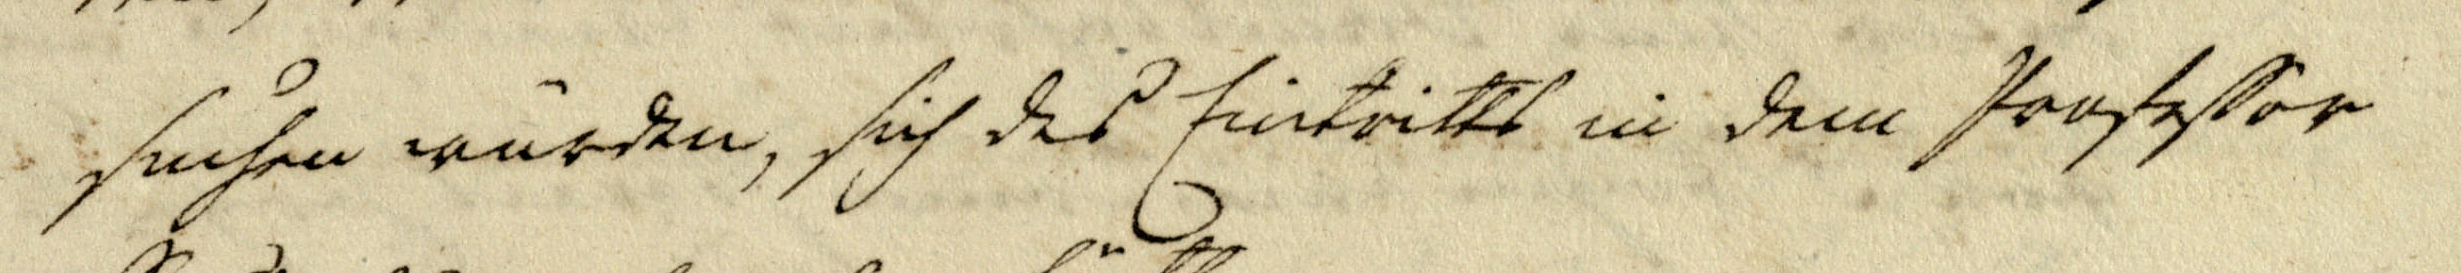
suchen würden, sich des Eintritts in dem Professor
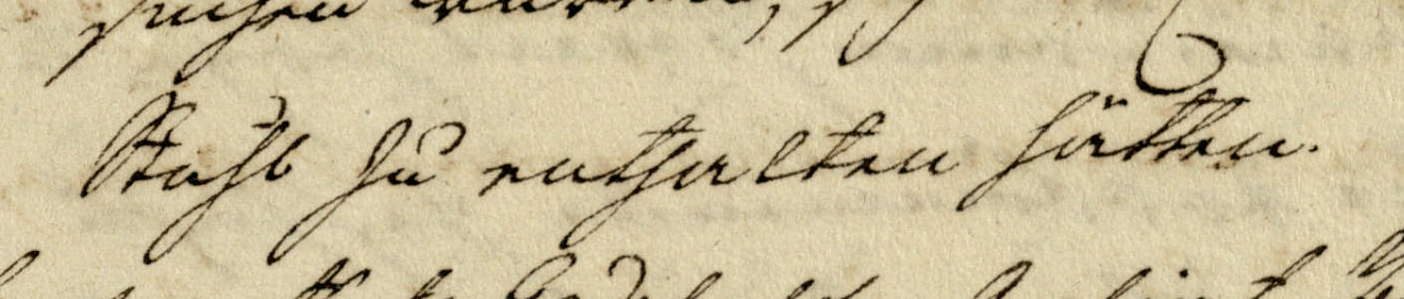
Stuhl zu enthalten hätten.
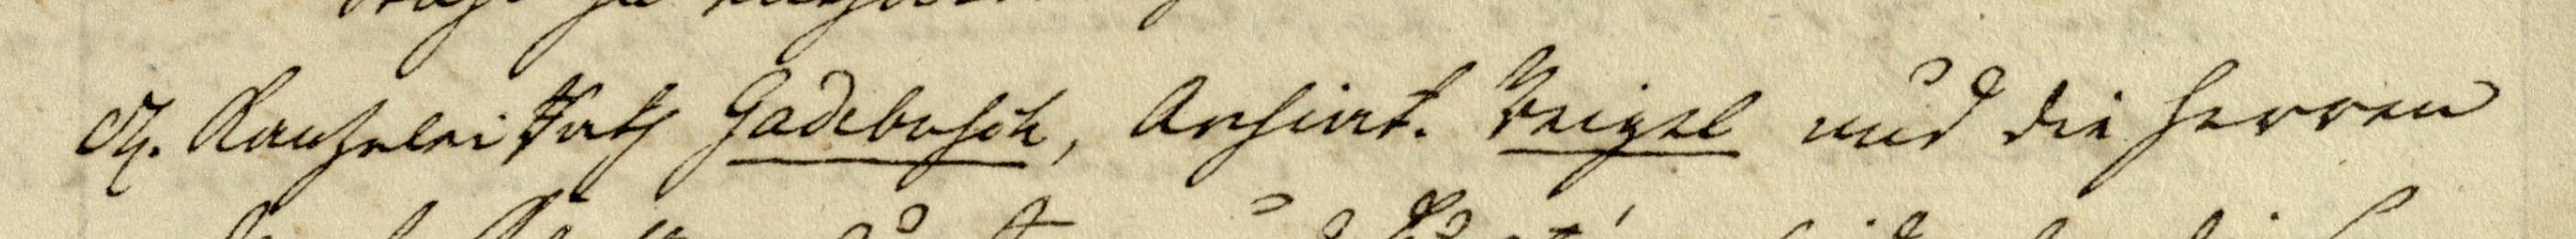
dh. Kanzelei Rath Gadebusch, Archiat. Weigel und die Herren
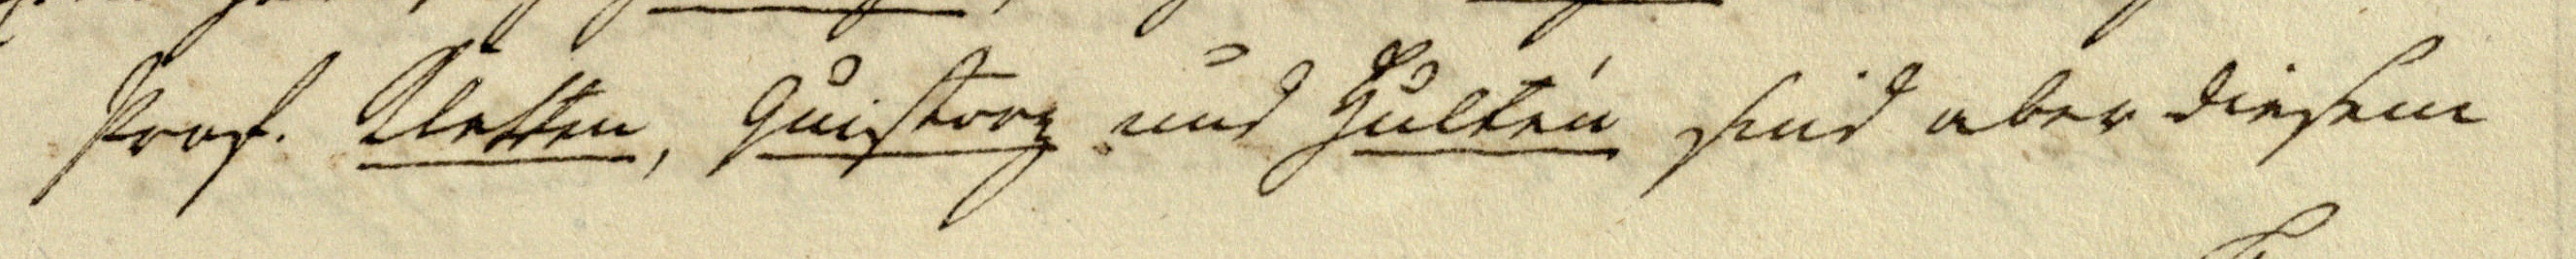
Prof. Kletten, Quistorp und Hultén sind aber diesem
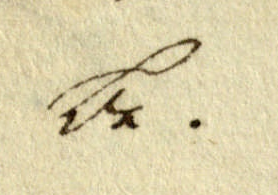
Be
